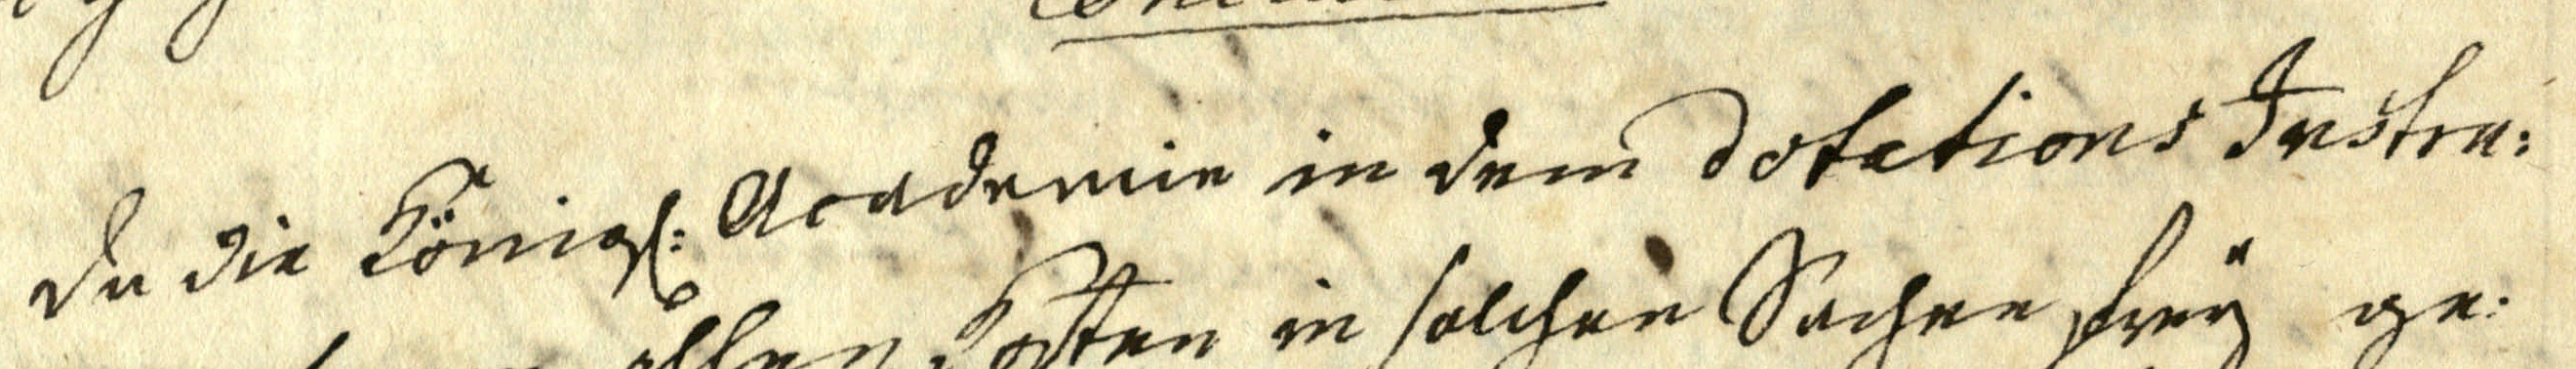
Da die Königl. Academie in dem dotations Instru¬
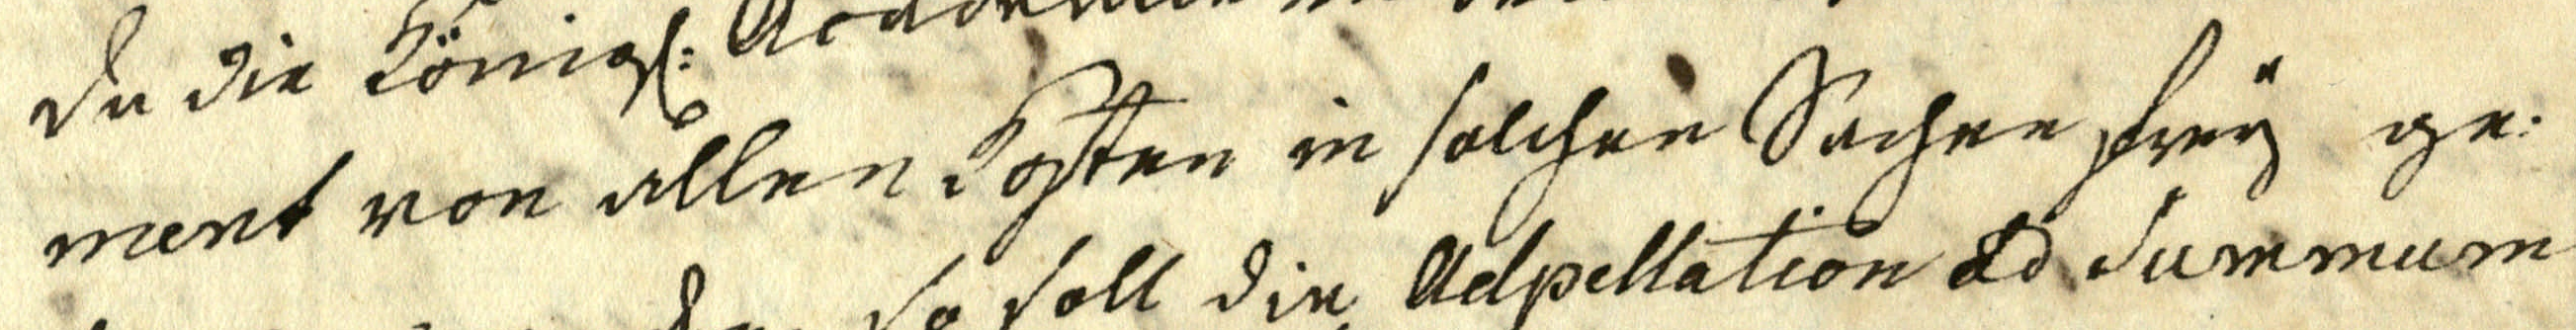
ment von allen Kosten in solchen Sachen freÿ ge¬
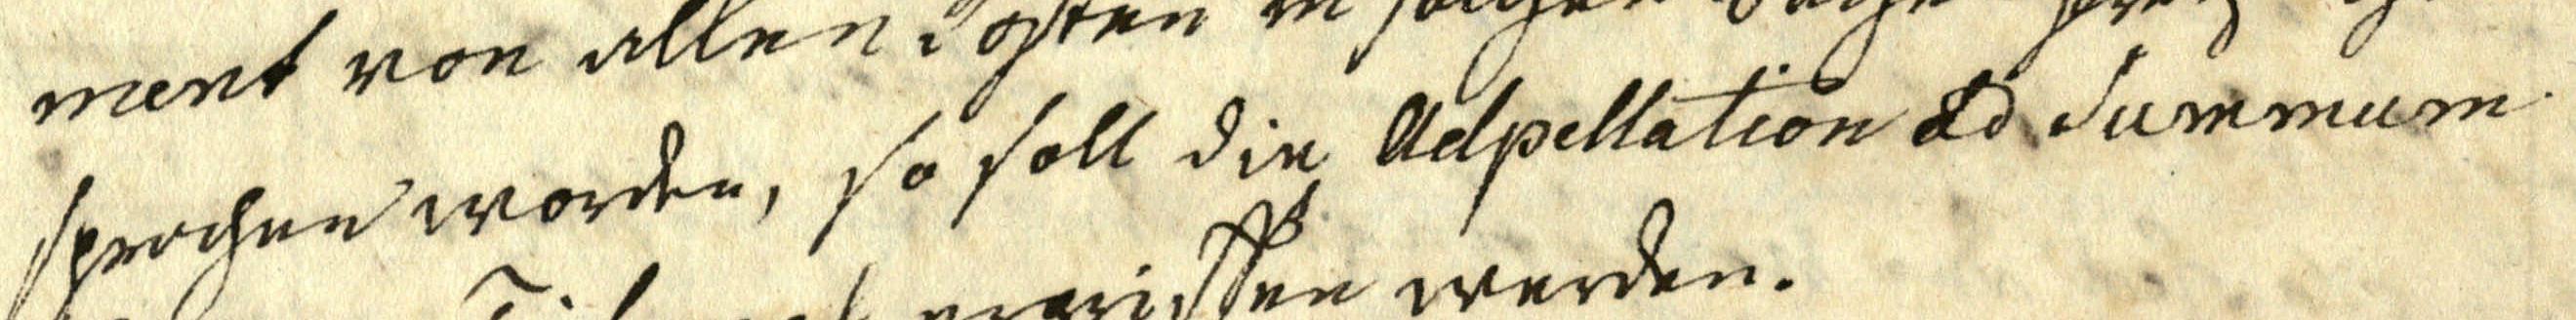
sprochen worden, so soll die Adpellation ad Summum
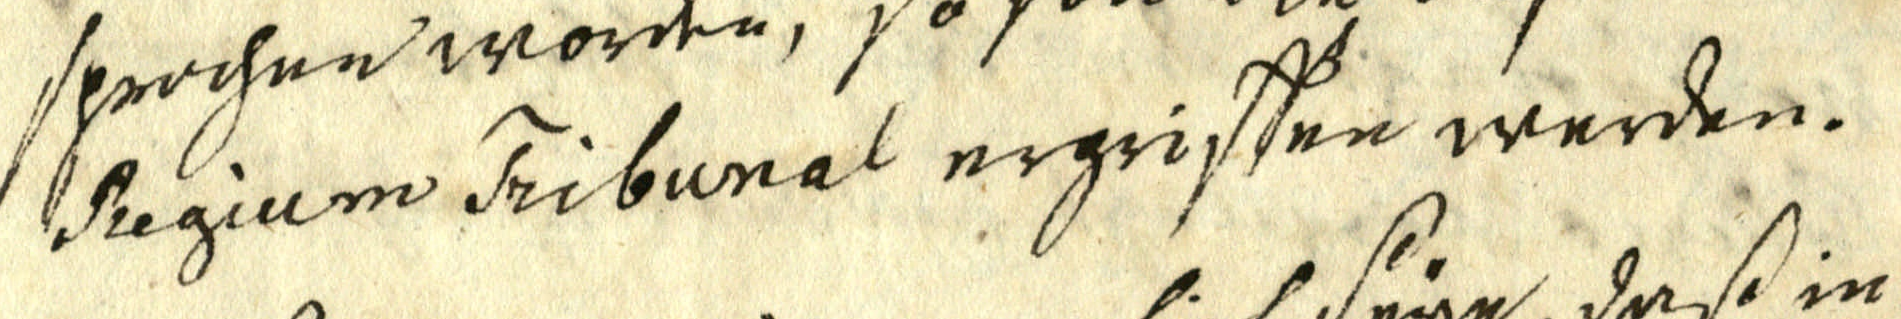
Regium Tribunal ergriffen werden.
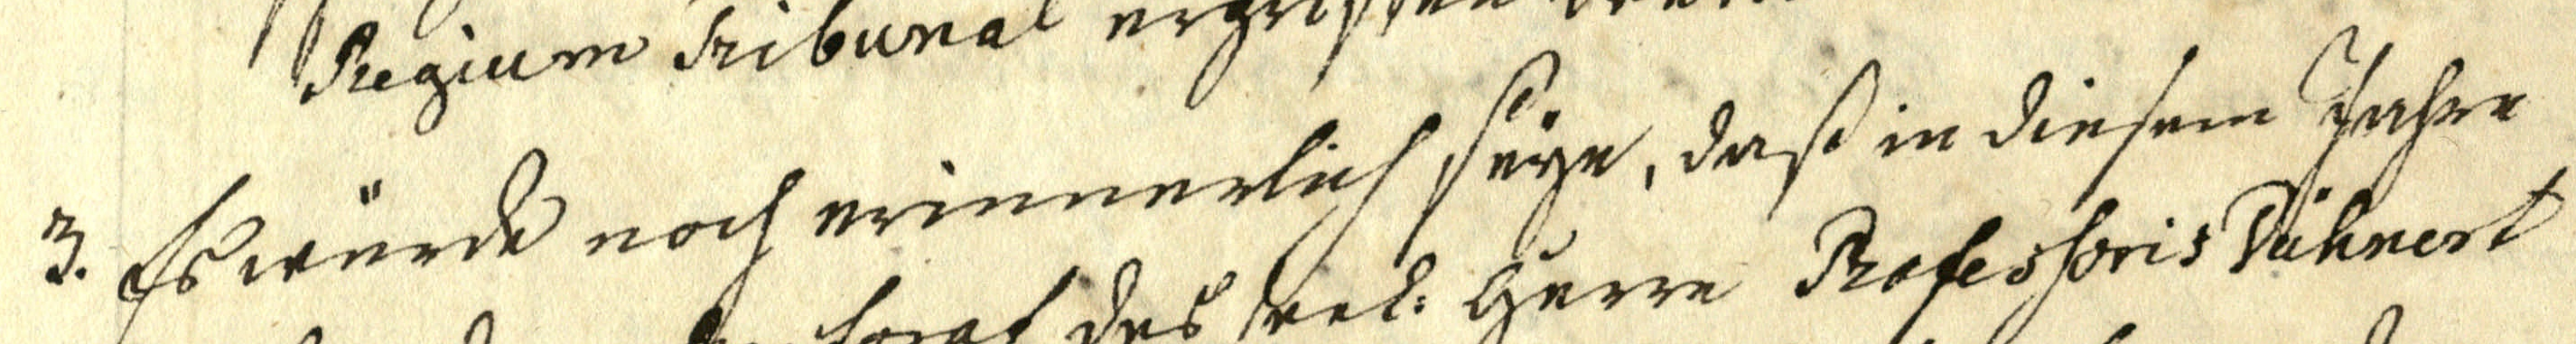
3. Es würde noch erinnerlich seÿn, daß in diesem Jahre
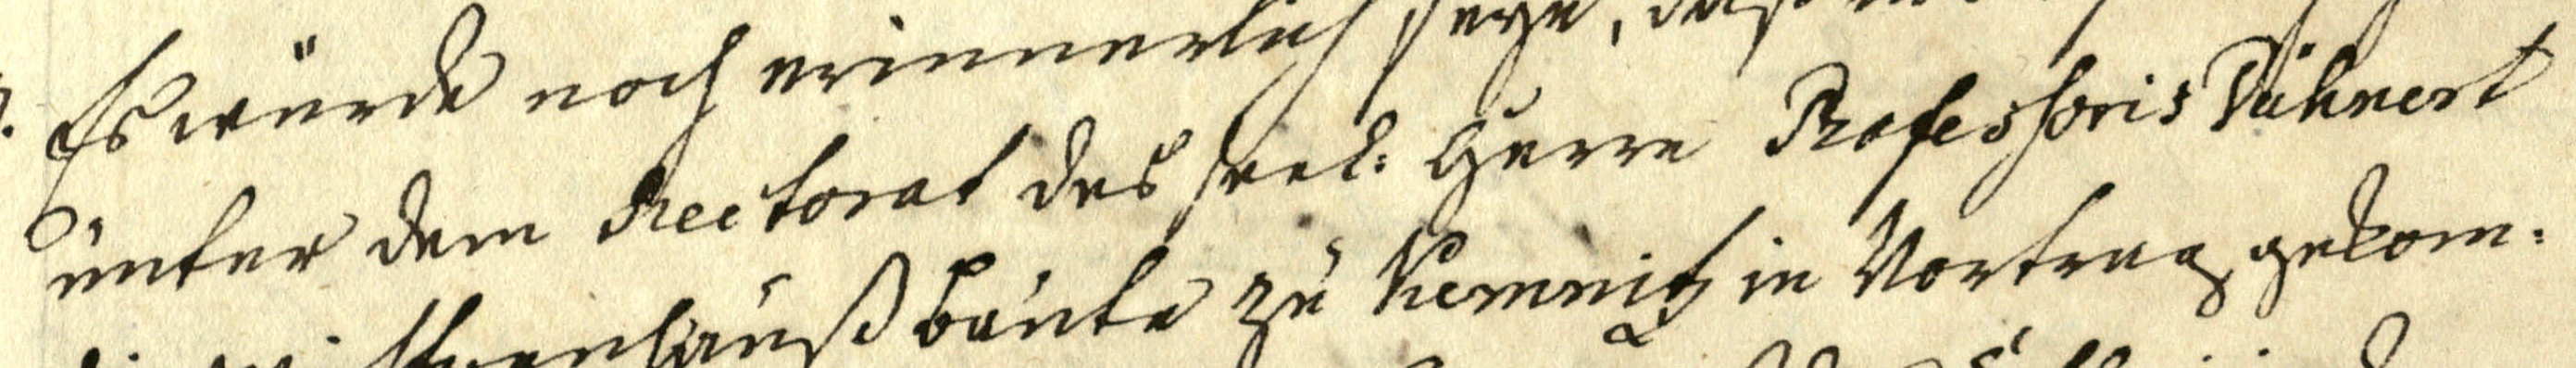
unter dem Rectorat des seel. Herrn Professoris Dähnert
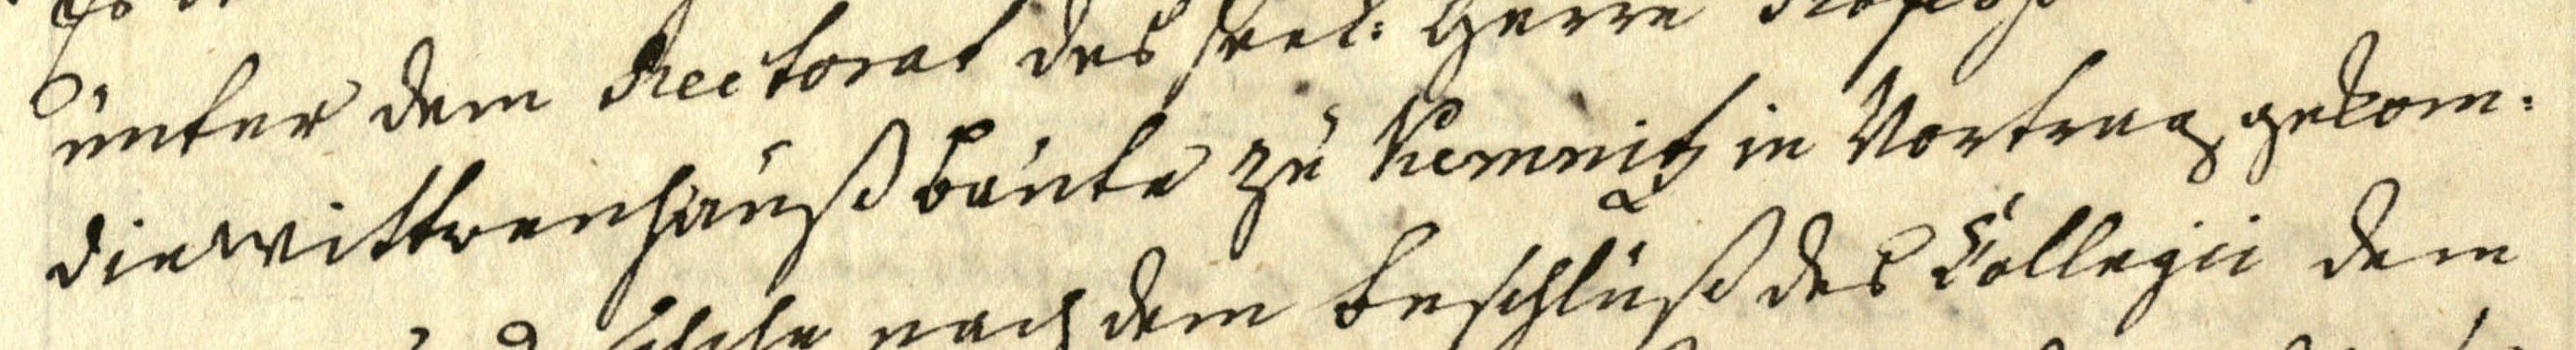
die wittwenhauß Baute zu Kemnitz in Vortrag gekom¬
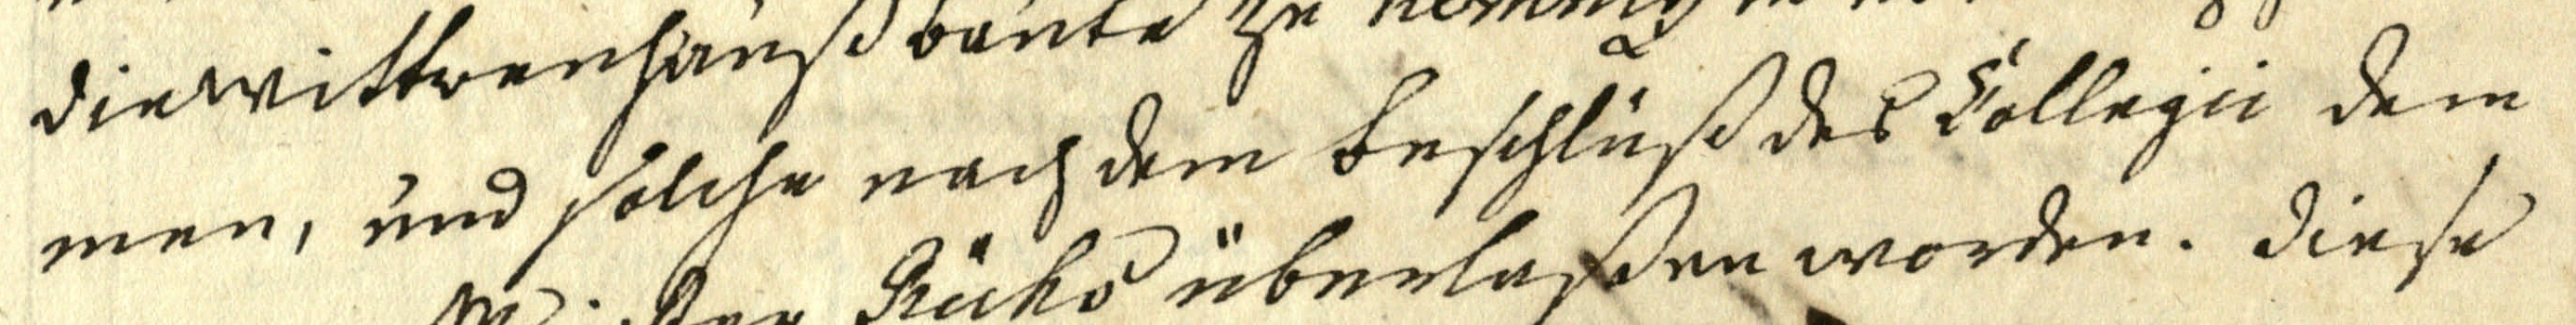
men, und solche nach dem Beschluß der Collegii dem
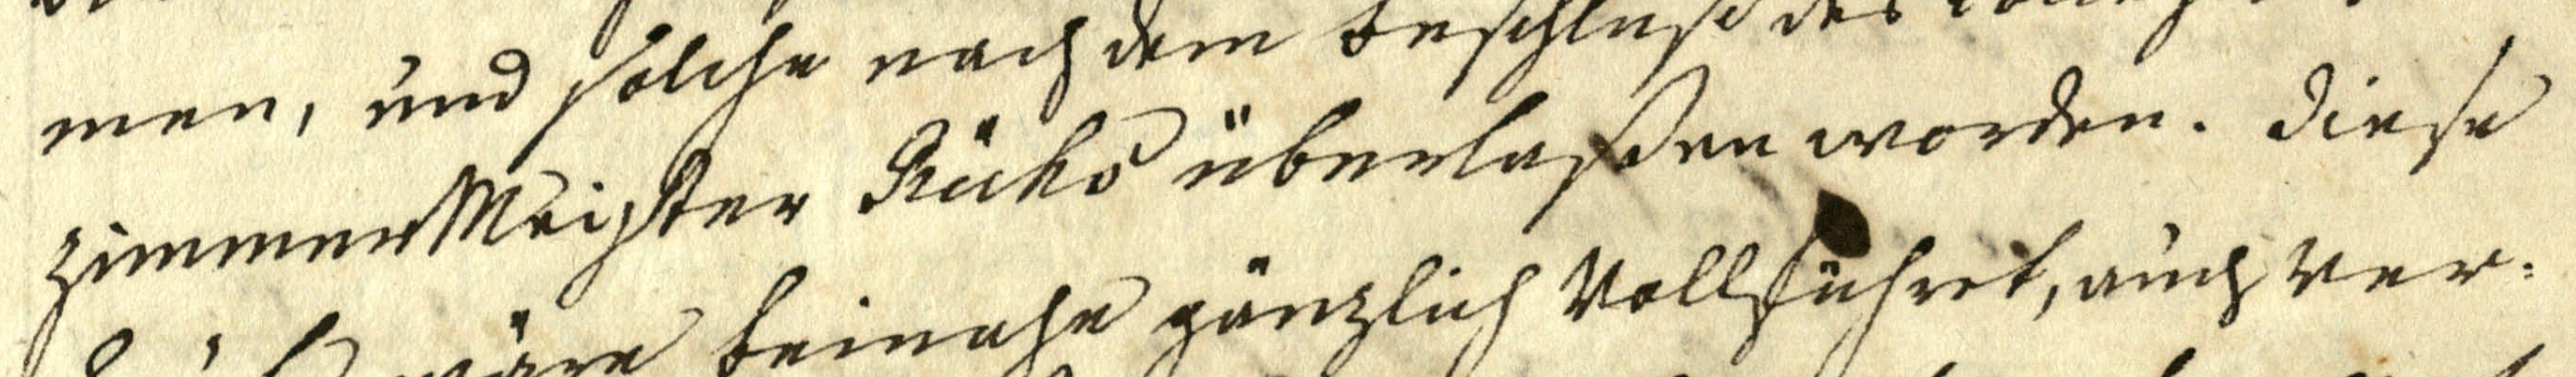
ZimmerMeister Rühs überlaßen worden. Diese
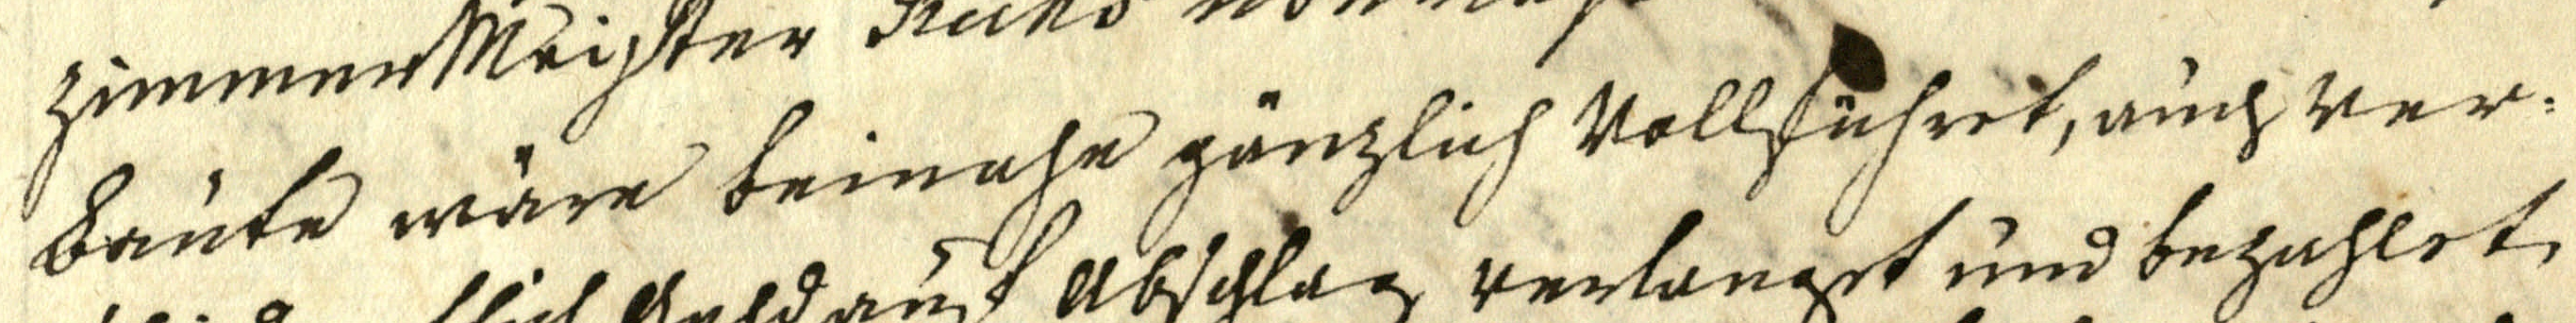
Baute wäre beinahe gänzlich vollführet, auch ver¬
